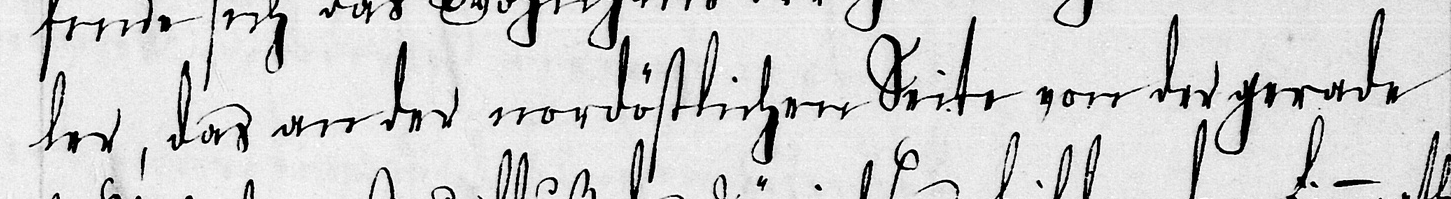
ler, das an der nordöstlichen Seite von der gerade
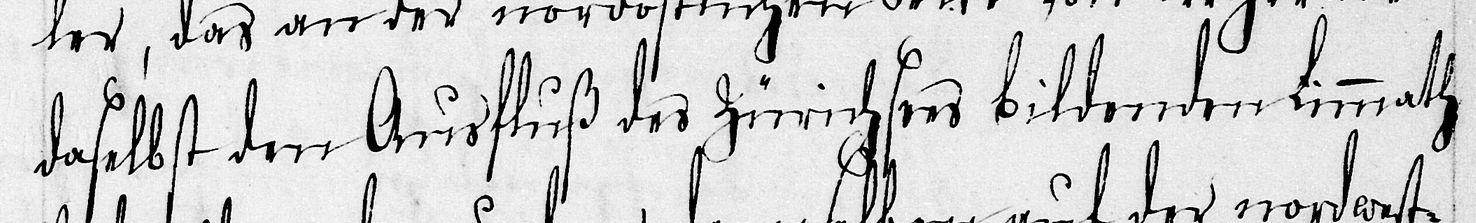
daselbst den Ausfluß des Zürichsees bildenden Limmath
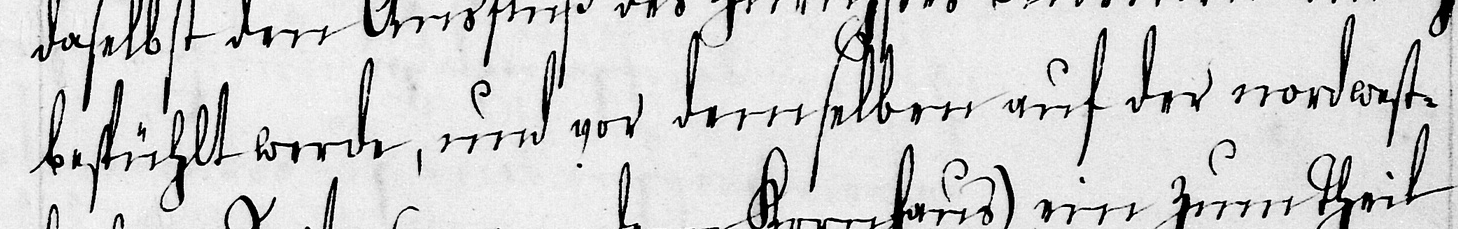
bespühlt werde, und vor demselben auf der nordwes¬
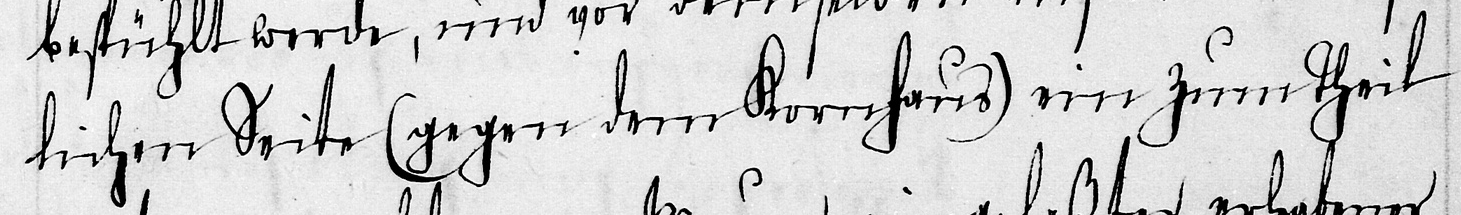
tlichen Seite (gegen dem Kornhaus) ein zum Theil
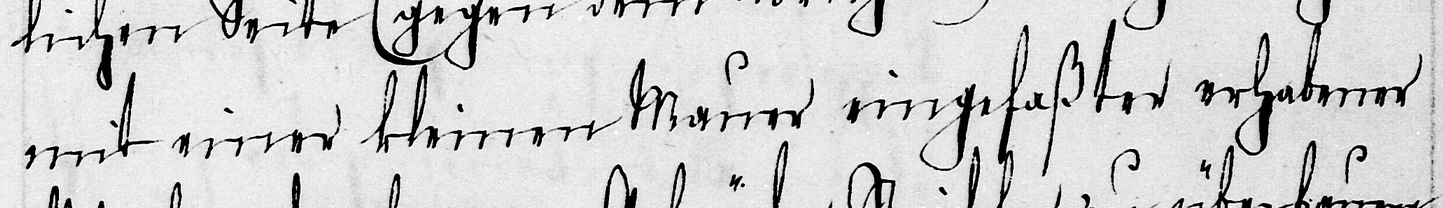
mit einer kleinen Mauer eingefaßter erhabener
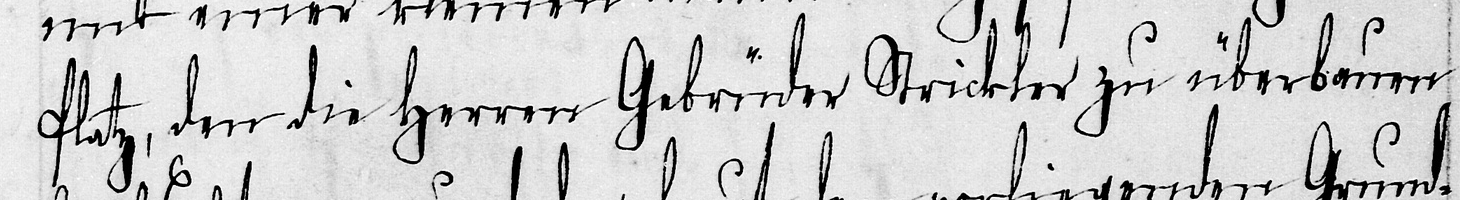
Platz, den die Herren Gebrüder Strickler zu überbauen
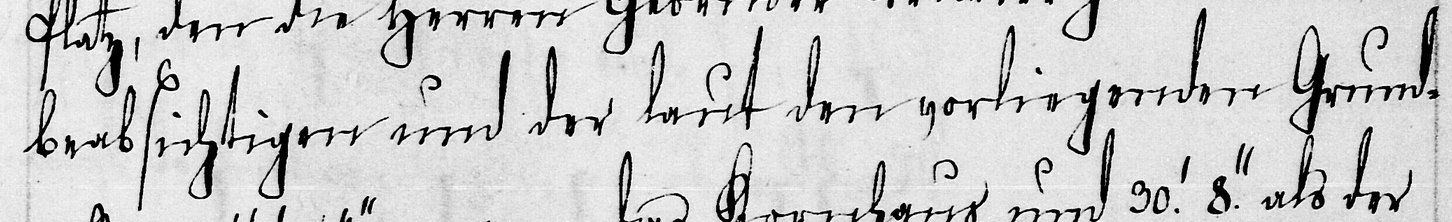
beabsichtigen und der laut den vorliegenden Grund¬
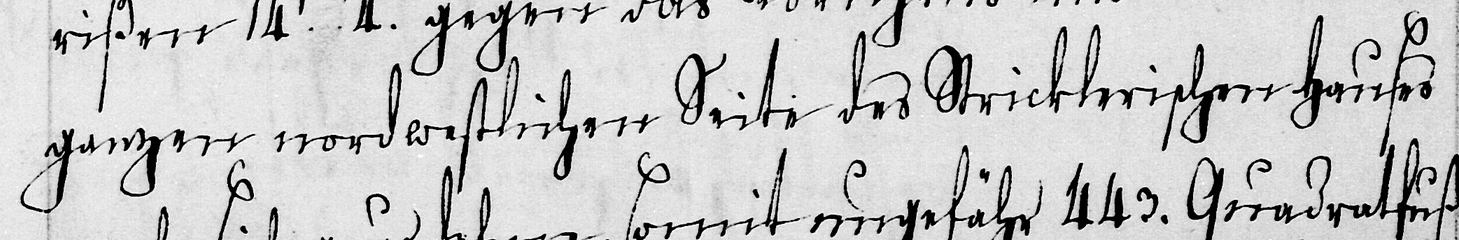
ganzen nordwestlichen Seite des Stricklerischen Hauses
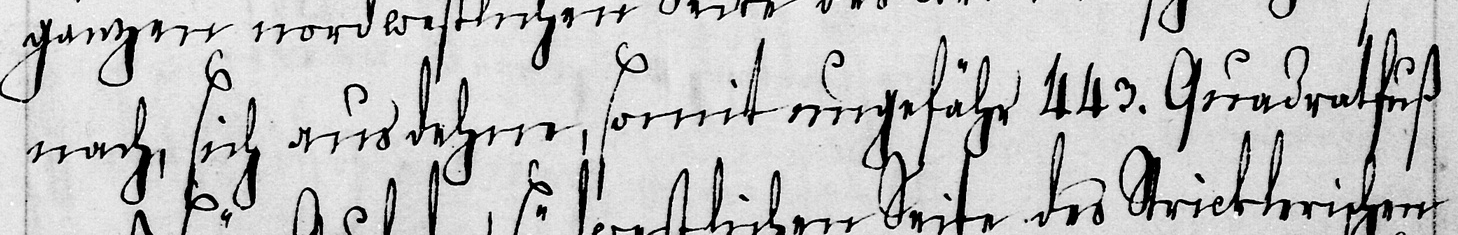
nach, sich ausdehne, somit ungefähr 443. Quadratfuß
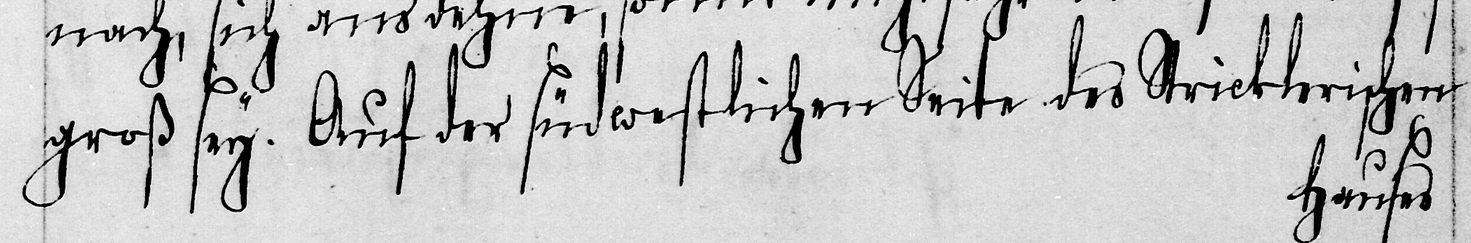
groß sey. Auf der südwestlichen Seite des Stricklerischen
